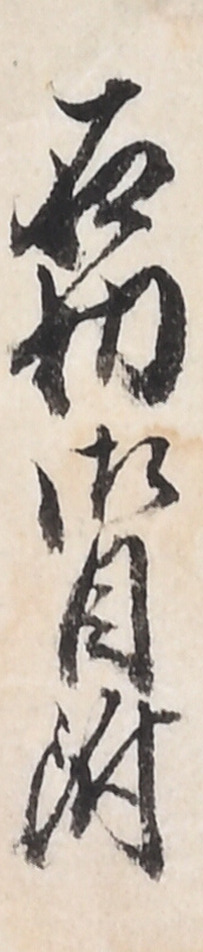石切御目附
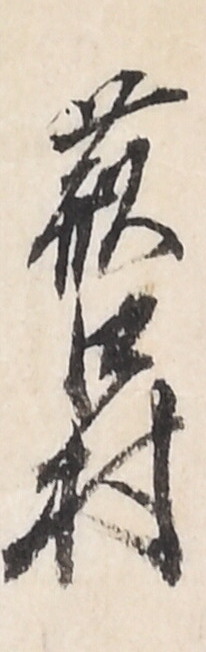荊口村
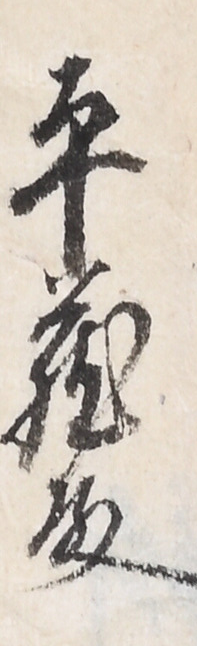平蔵様
